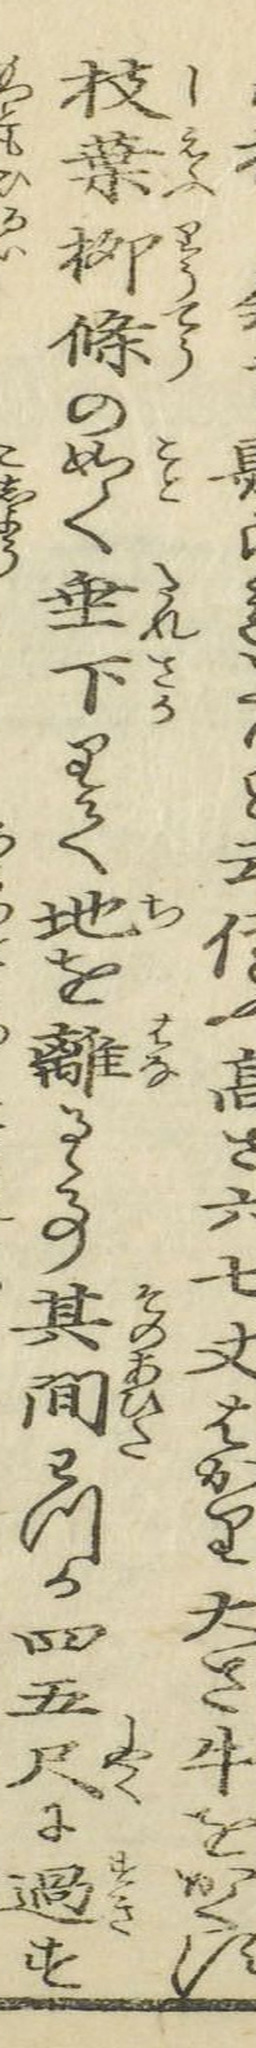枝葉栁條の如く垂下りて地を離るゝ事其間わつか四五尺を過す
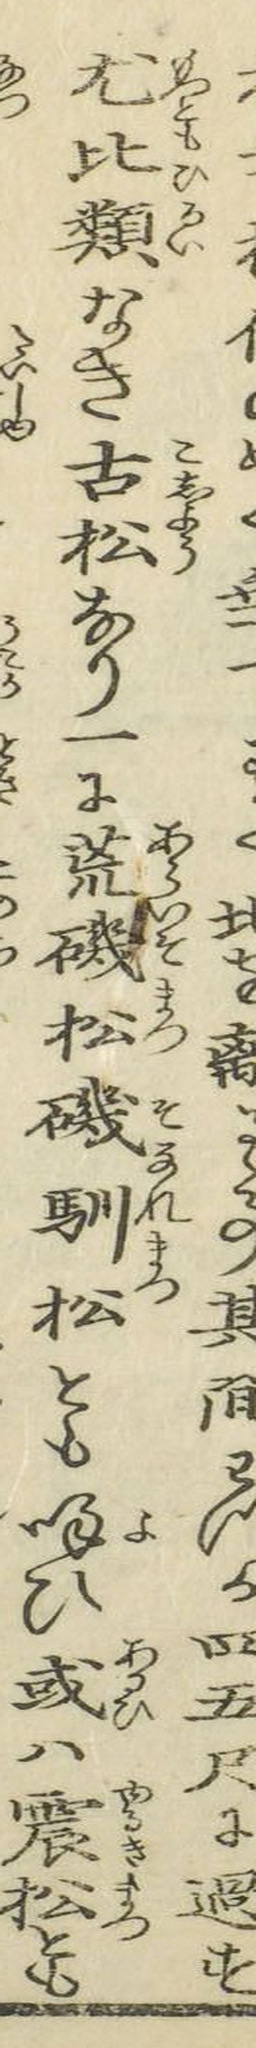尤比類なき古松なり一に荒磯松磯馴松とも呼ひ或は震松とも
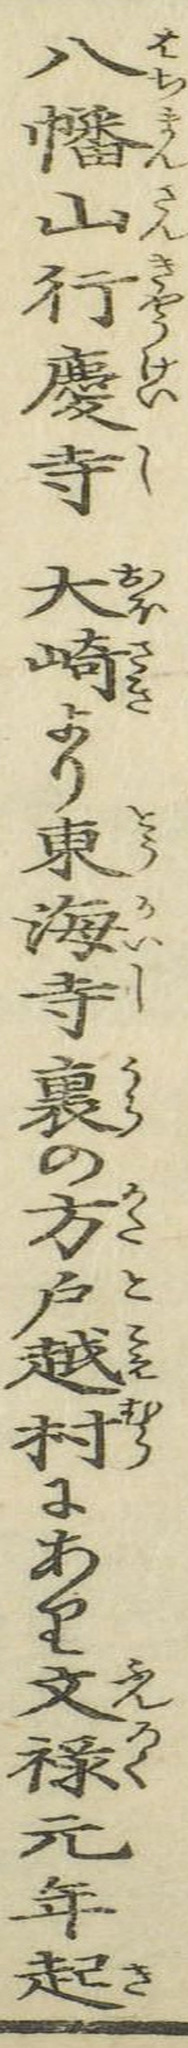八幡山行慶寺大崎より東海寺裏の方戸越村にあり文禄元年起
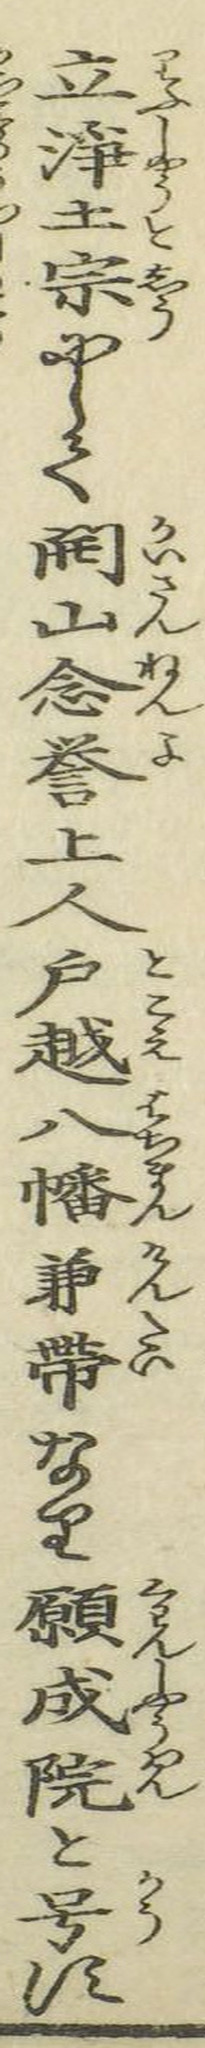立淨土宗にして開山念誉上人戸越八幡兼帯なり願成院と号す
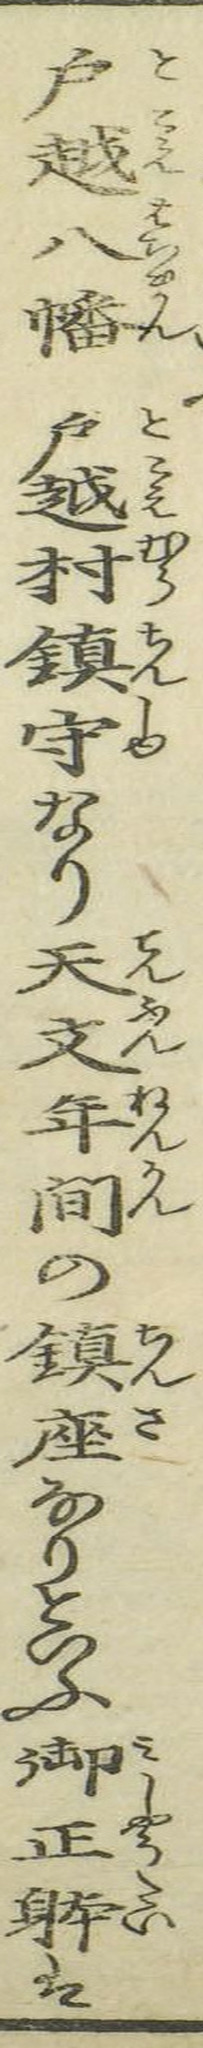戸越八幡戸越村鎮守なり天文年間の鎮座なりといふ御正躰は
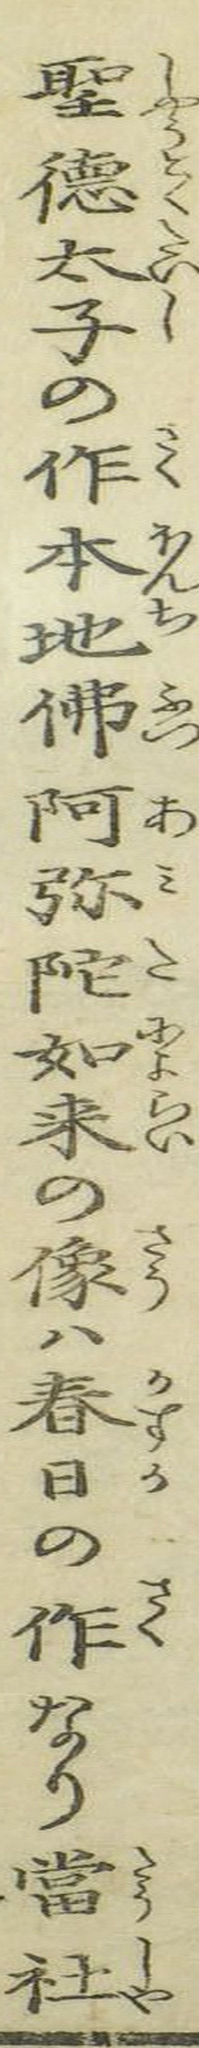聖徳太子の作本地佛阿弥陀如来の像は春日の作なり當社

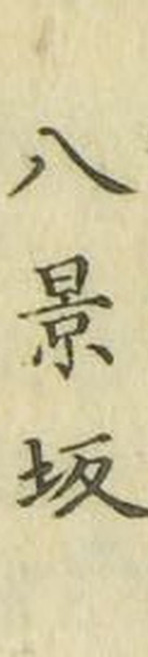八景坂
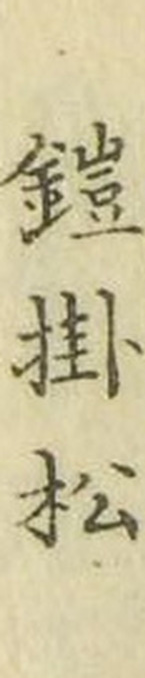鎧掛松

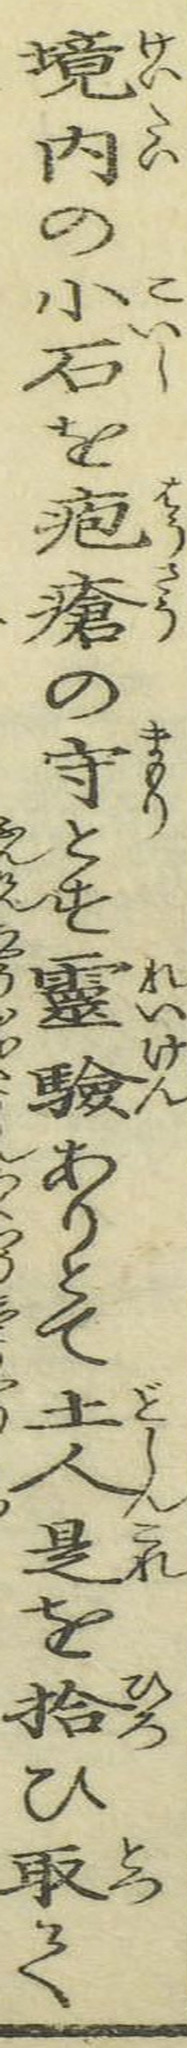境内の小石を疱瘡の守とす靈驗ありとて土人是を拾ひ取て
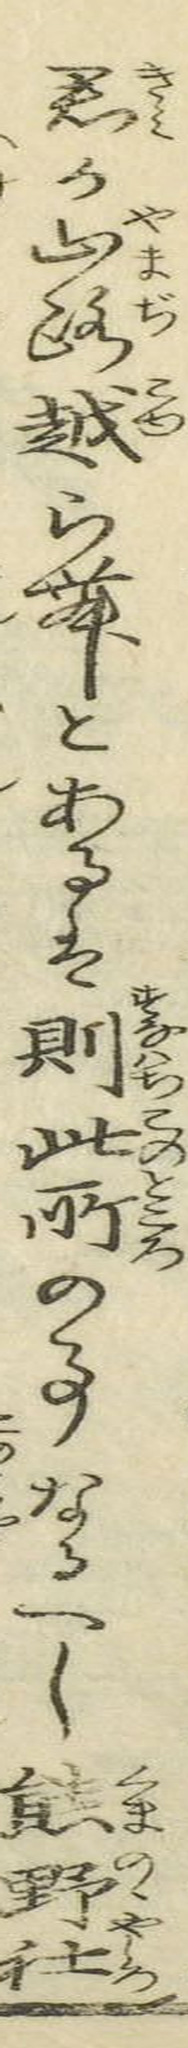君か山路越らむとあるは則此所の事なるへし熊野社
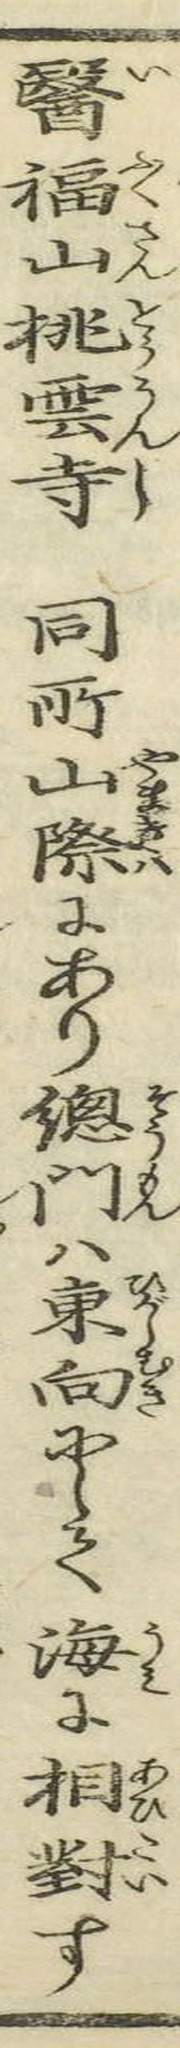醫福山桃雲寺同所山際にあり總門は東向にして海に相對す
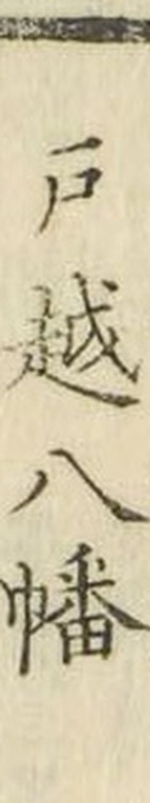戸越八幡

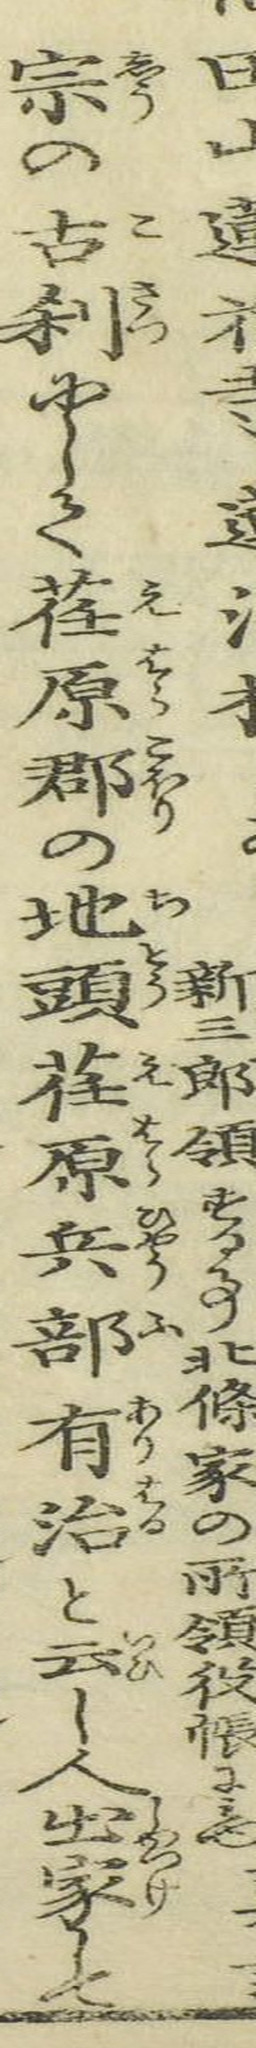宗の古刹にして荏原郡の地頭荏原兵部有治と云し人出家して
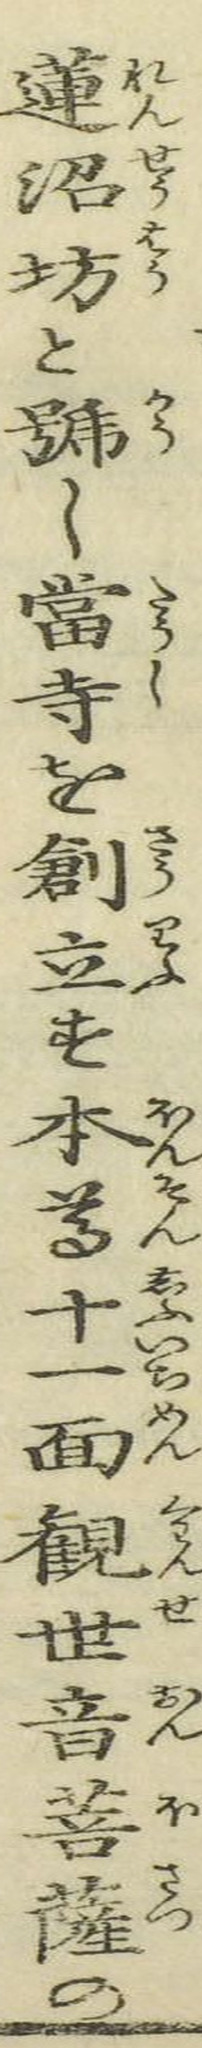蓮沼坊と號し當寺を創立す本尊十一面観世音菩薩の
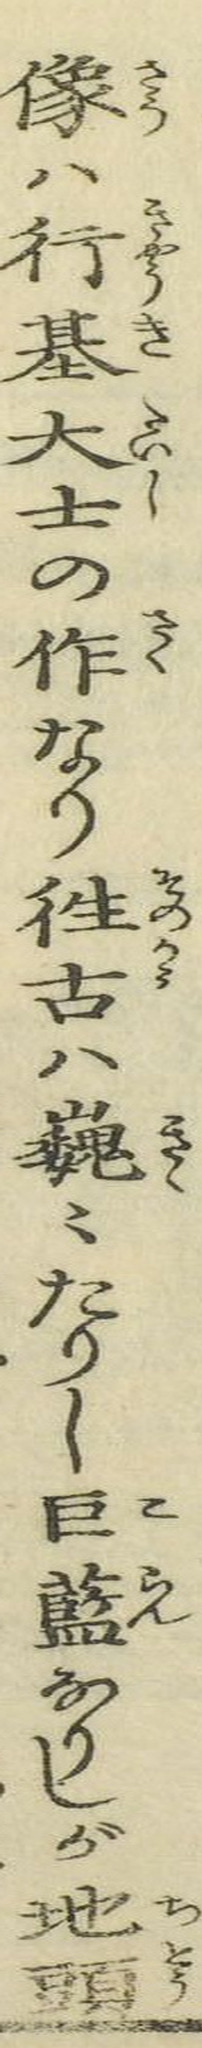像は行基大士の作なり往古は巍々たりし巨藍なりしが地頭
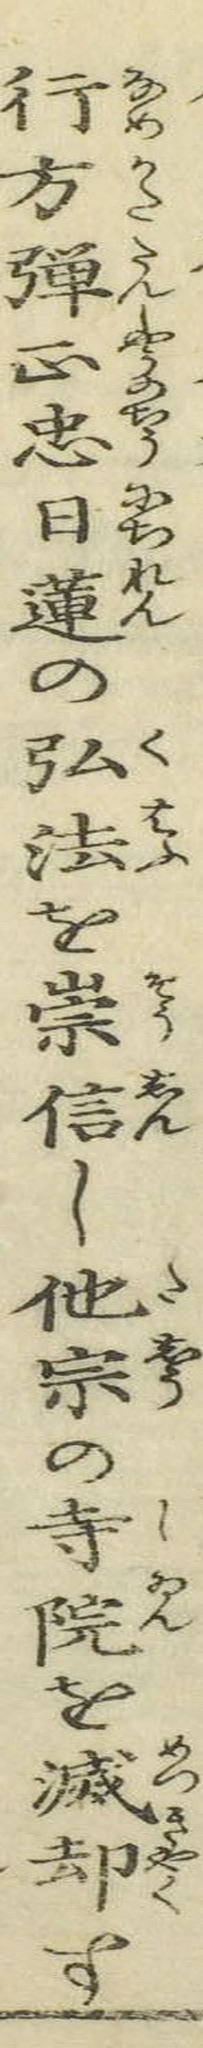行方弾正忠日蓮の弘法を崇信し他宗の寺院を滅却す
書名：江戸名所図会 20巻 巻之4
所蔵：東京学芸大学教育コンテンツアーカイブ
